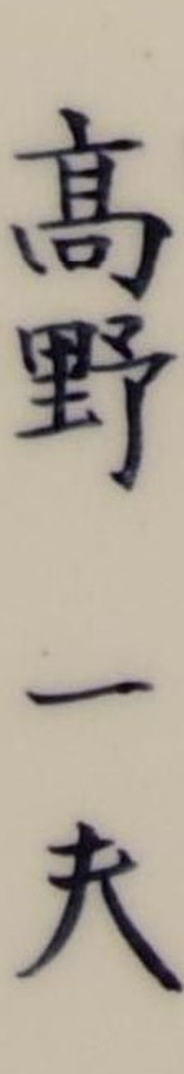高野一夫
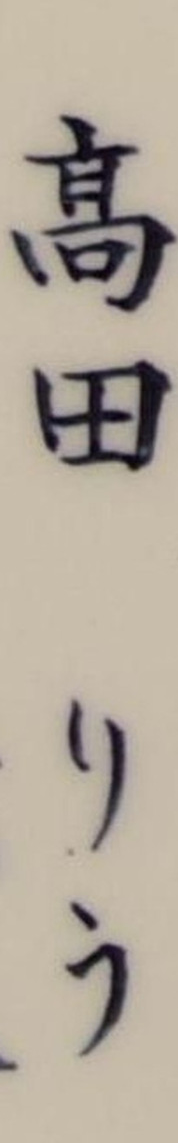高田りう
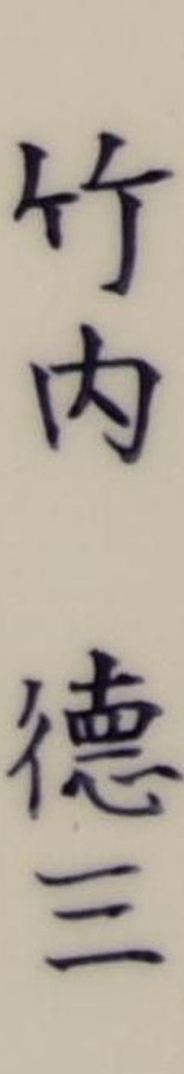竹内徳三
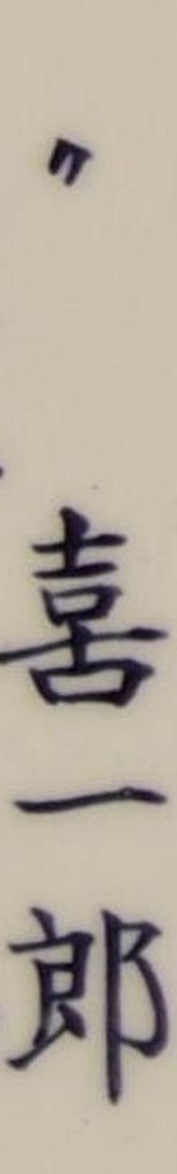喜一郎
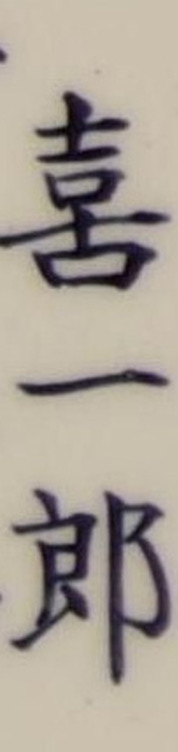喜一郎

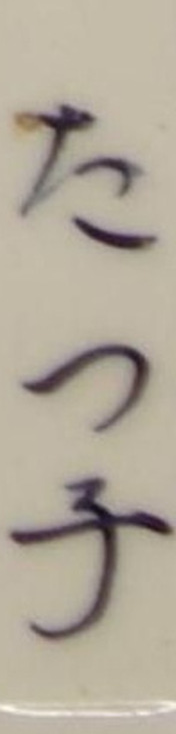たつ子
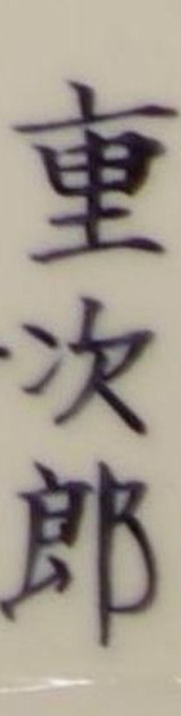重次郎
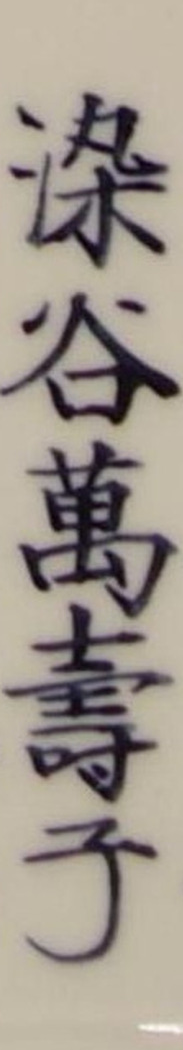染谷萬壽子
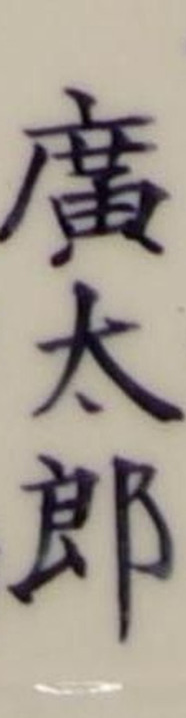廣太郎
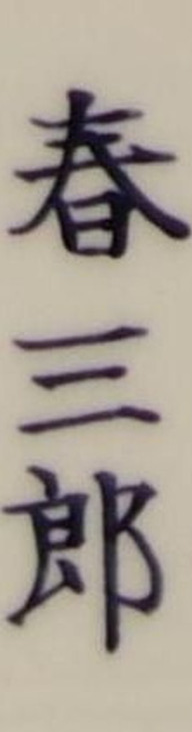春三郎
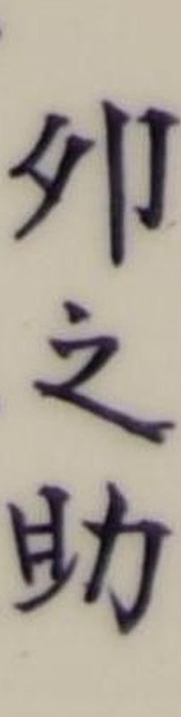卯之助

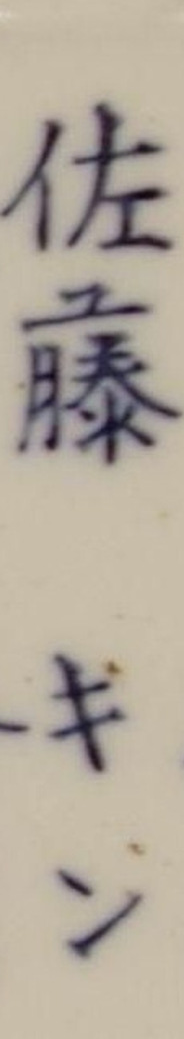佐藤キン
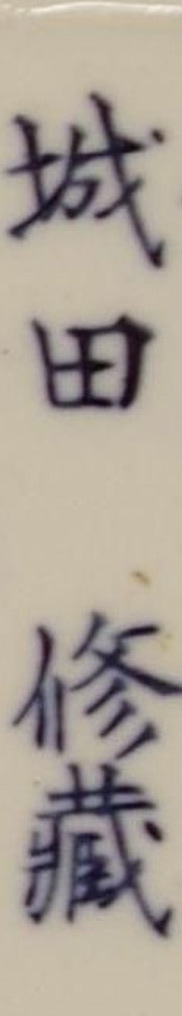城田修蔵
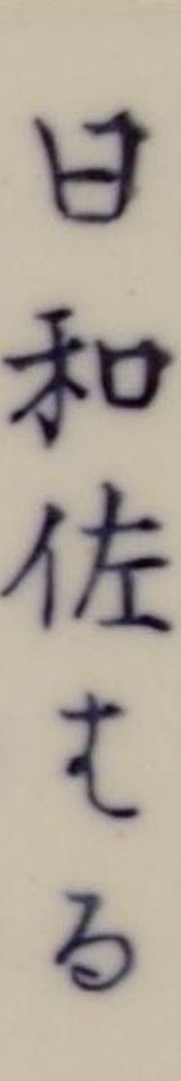日和佐はる
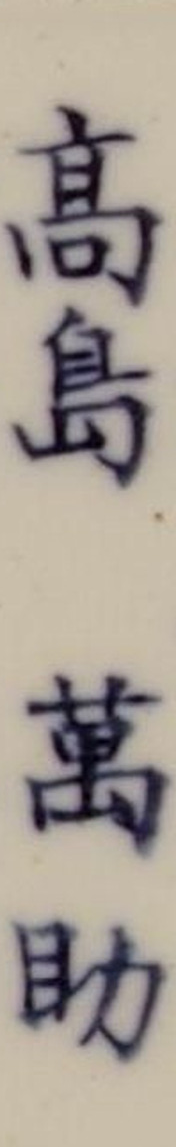高島萬助
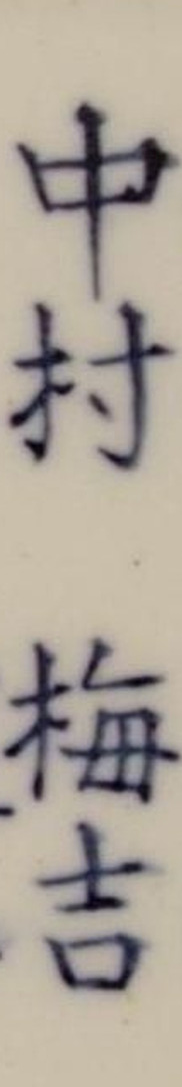中村梅吉
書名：E~L
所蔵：高野山金剛峯寺
